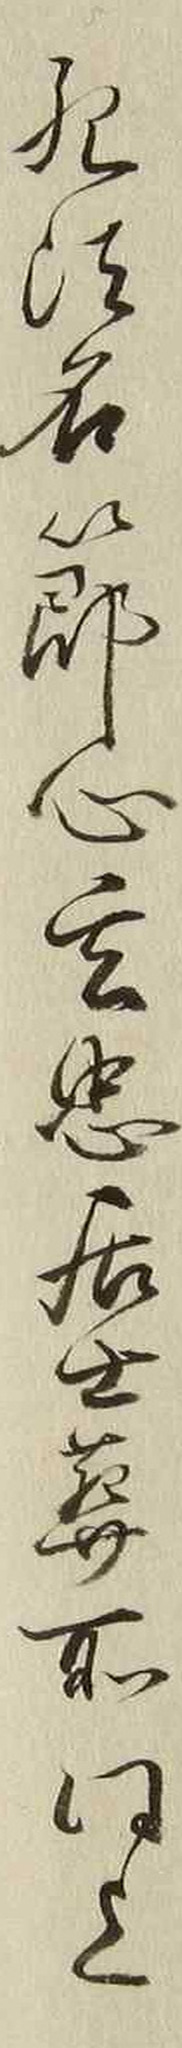死法名節心玄忠居士葬所同上
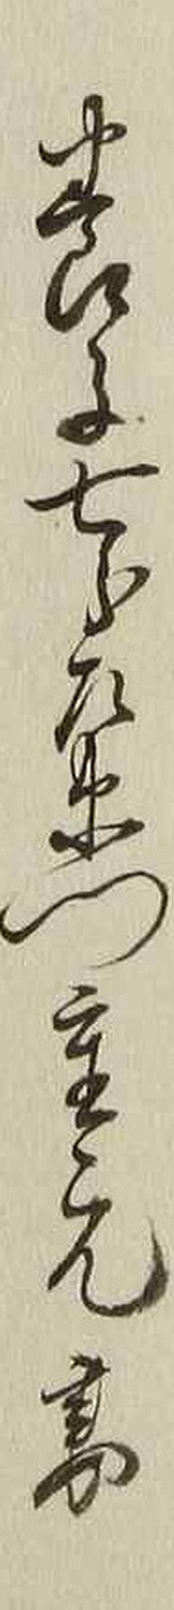女養子七郎左衛門重元妻
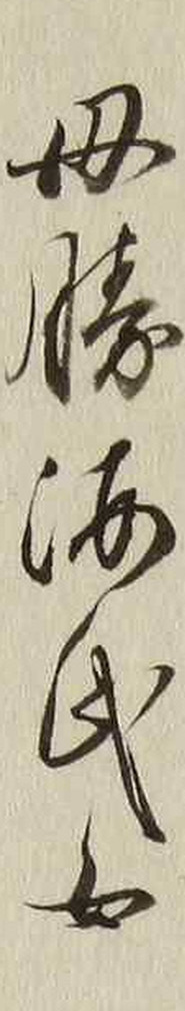母勝海氏女
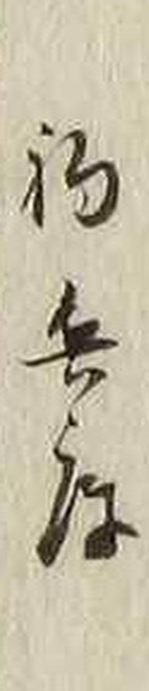初兵庫
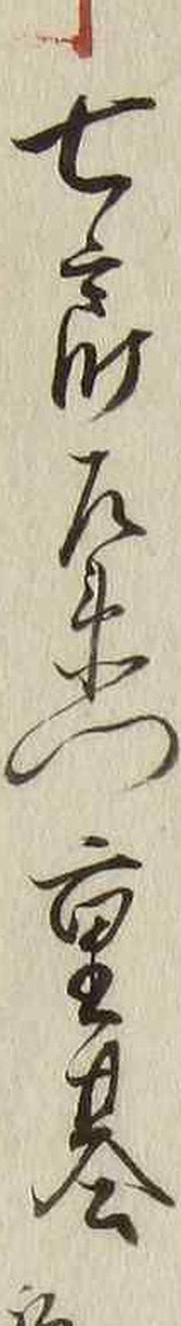七郎左衛門重基
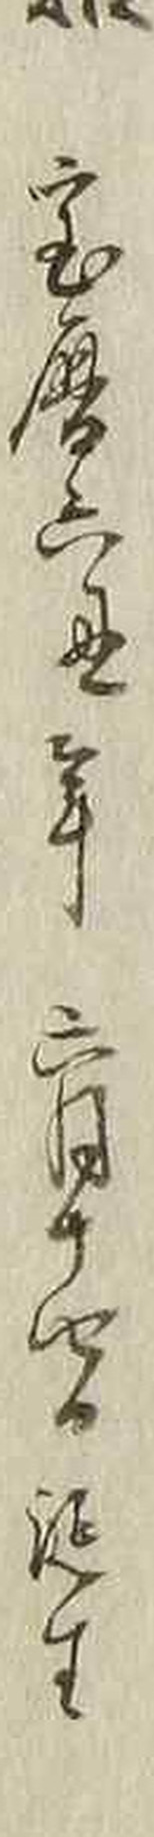初重矩宝暦六丑年六月十四日誕生
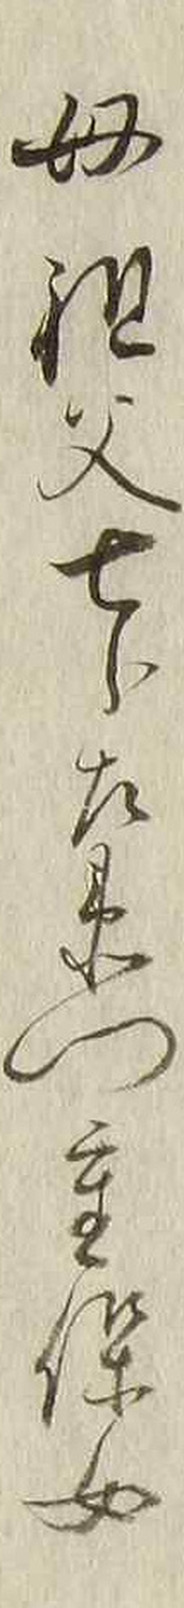母祖父七郎左衛門重保女
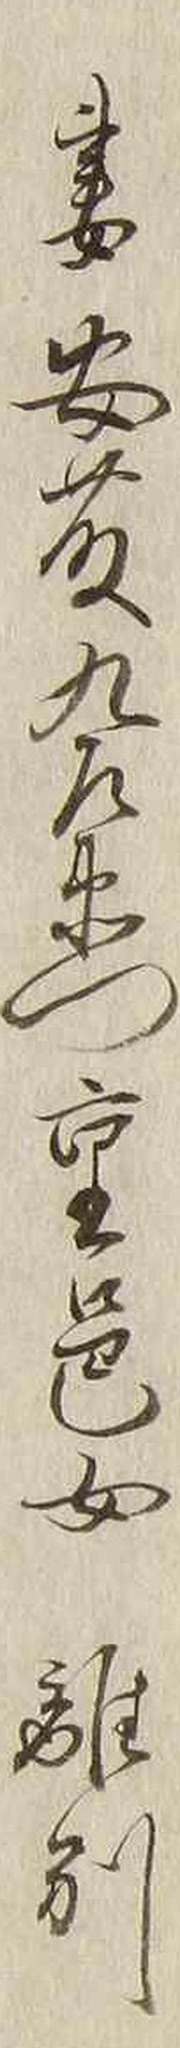妻安藤九左衛門重邑女離別
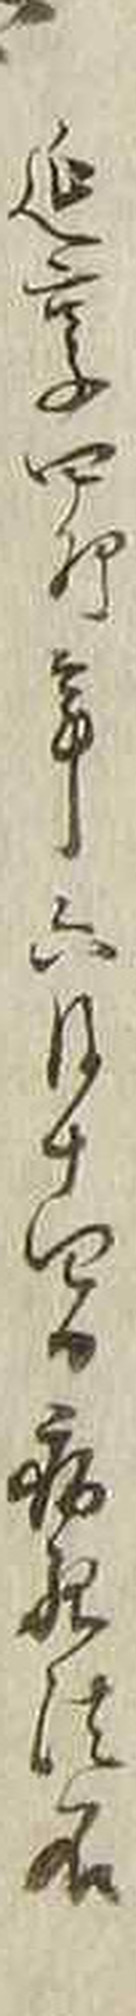延享四卯年六月十四日病死法名
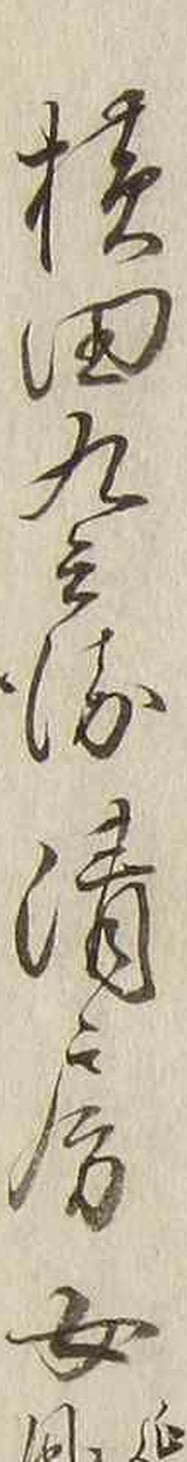横田九兵衛清房女
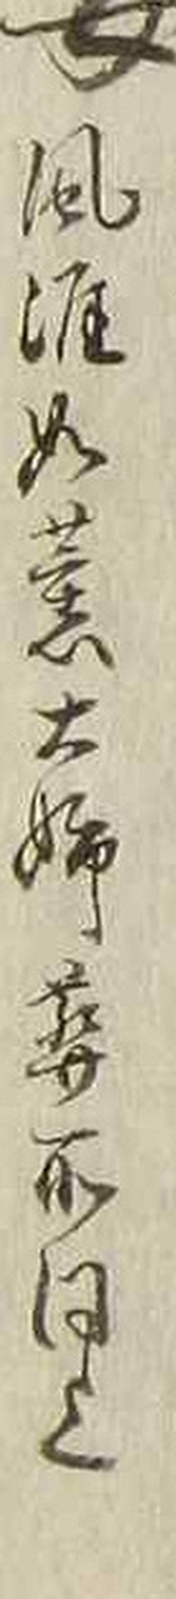風雅如薫大姉葬所同上

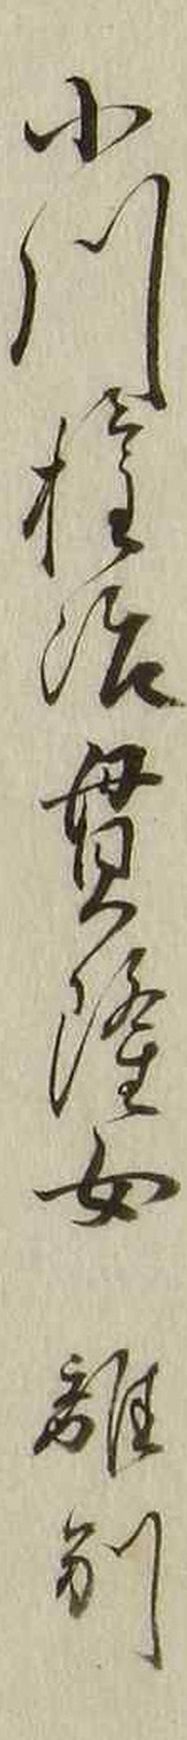小川権治貫隆女離別
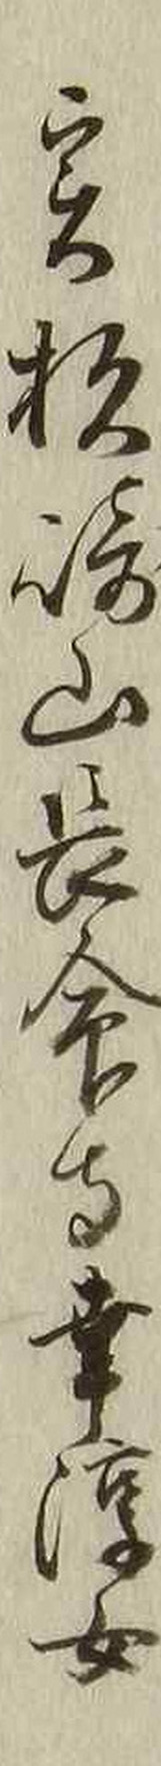実杉崎山長命寺幸淳女
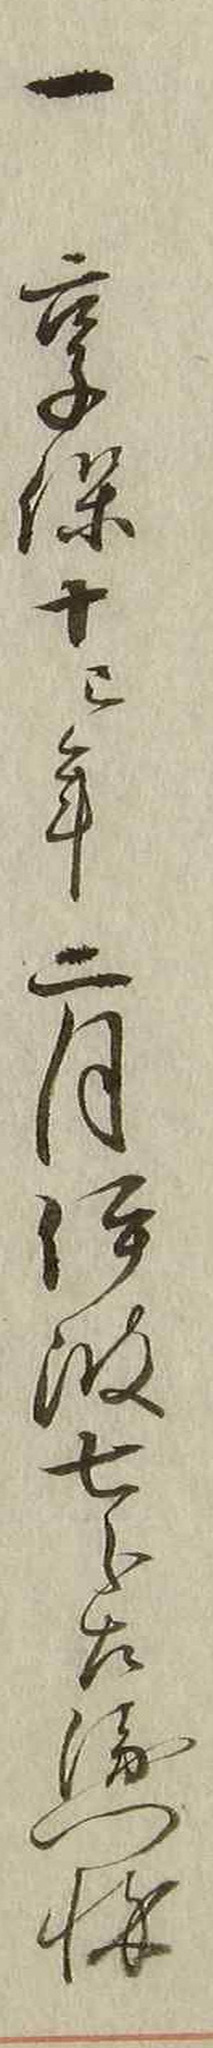一享保十巳年二月伊波七郎左衛門倅
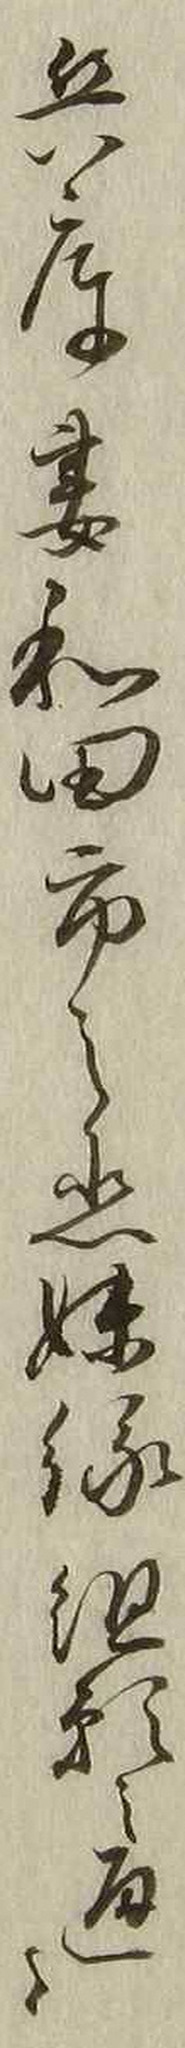兵庫妻和田市之丞妹縁組願い之通りと
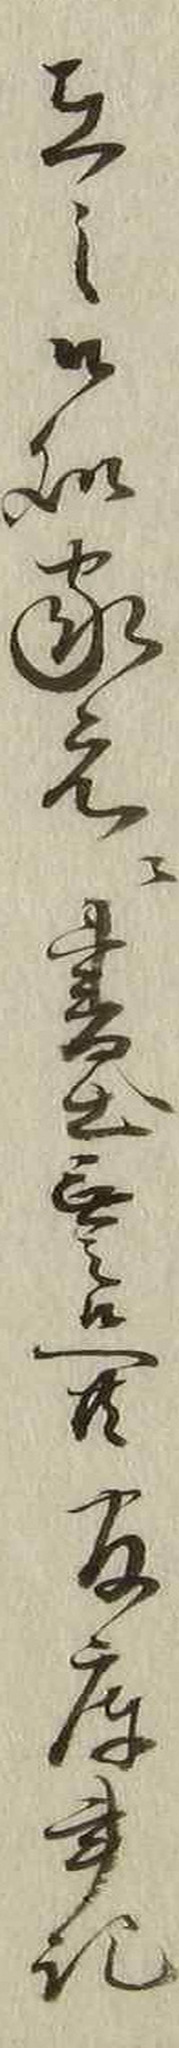有之候処家元ニ書き出し之無く候得共官庫書記
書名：諸士系譜　巻之20　い之部20
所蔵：会津若松市立会津図書館
